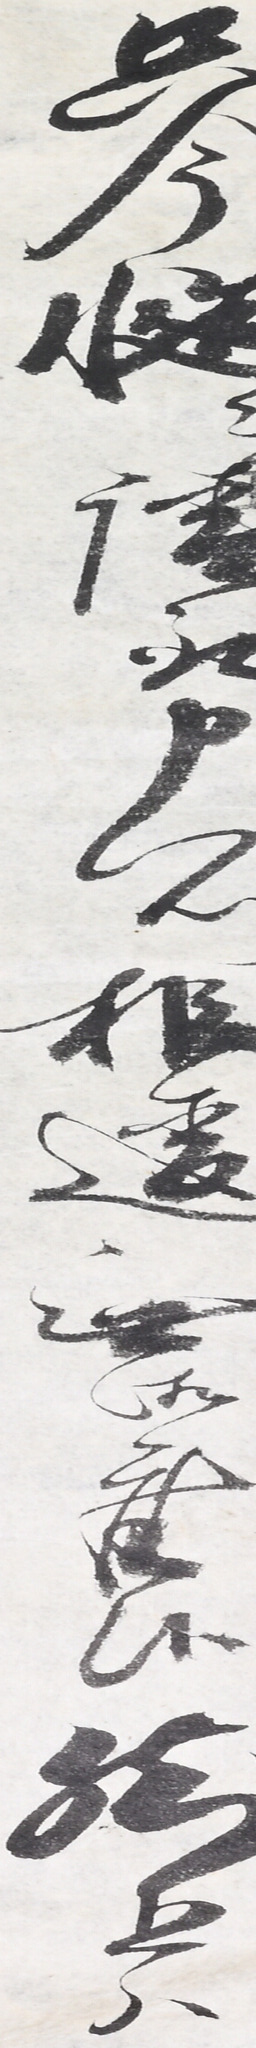只今慥ニ請取申所相違無御座候然上ハ
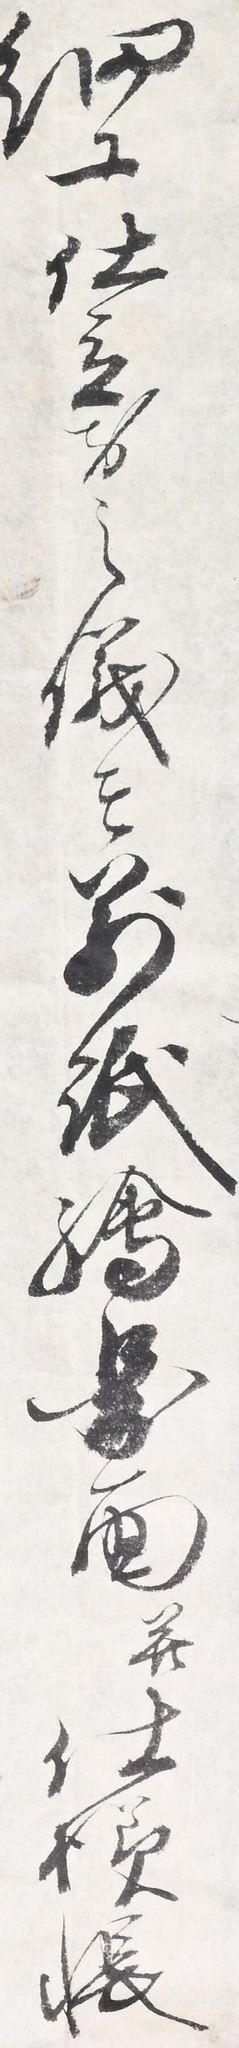細工仕立方之儀者別紙絵図面并仕様帳
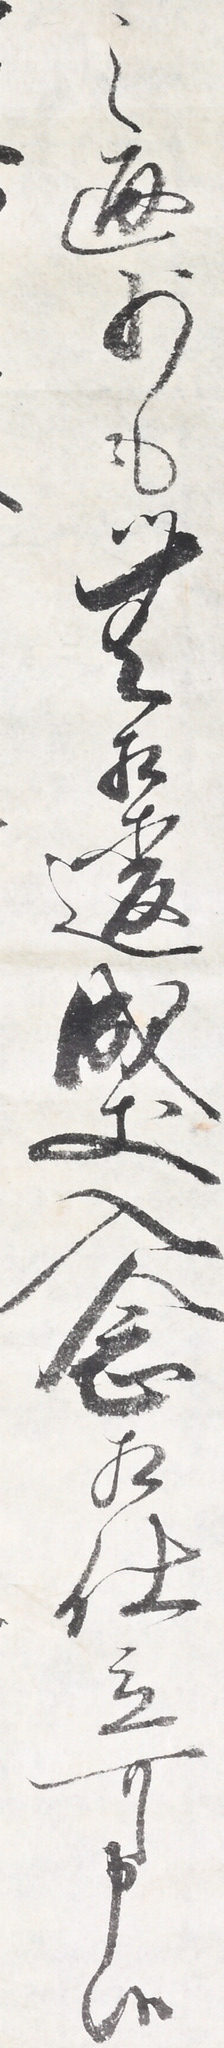之通少も無相違成丈入念相仕立可申候
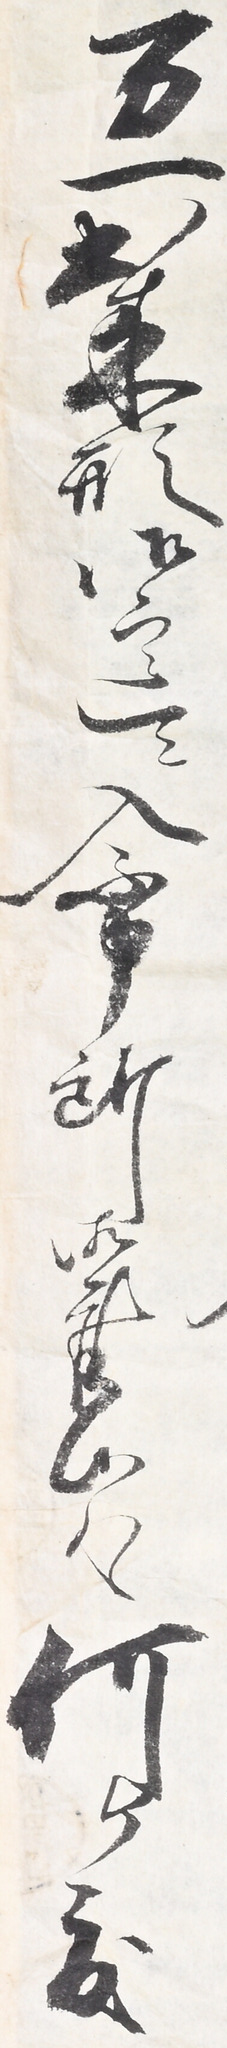万一出来形御意ニ入不申所御書候ハヽ何ヶ度
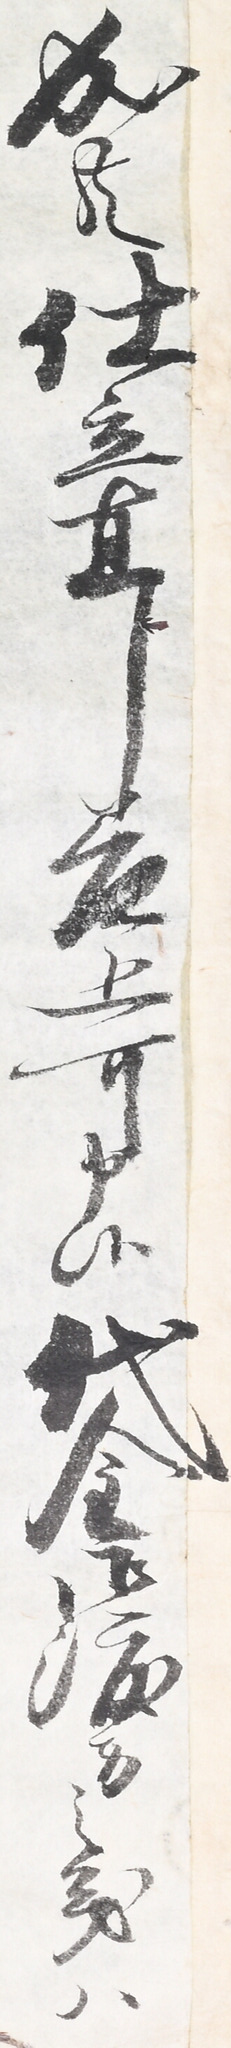成共仕立直申差上可申候代金御渡方之義ハ
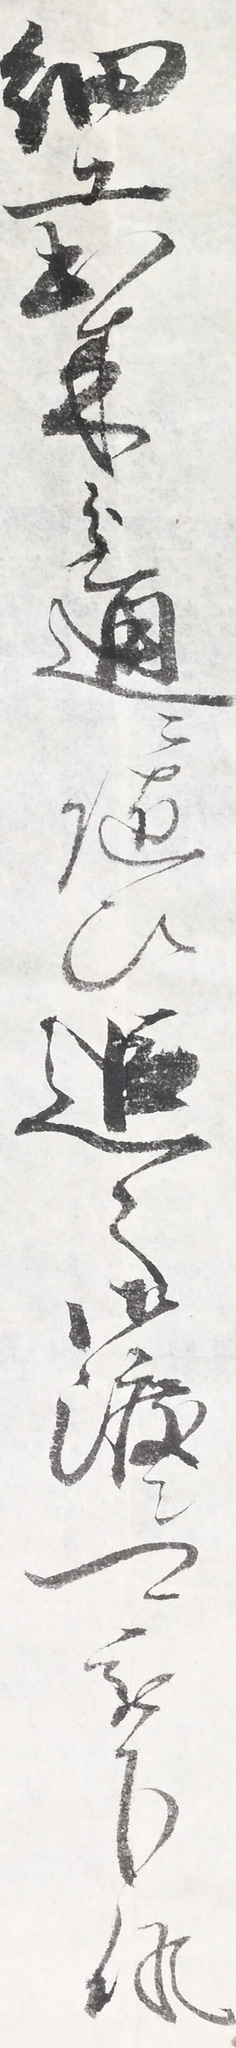細工出来分通ニ遵ひ追々御渡シ可被下候
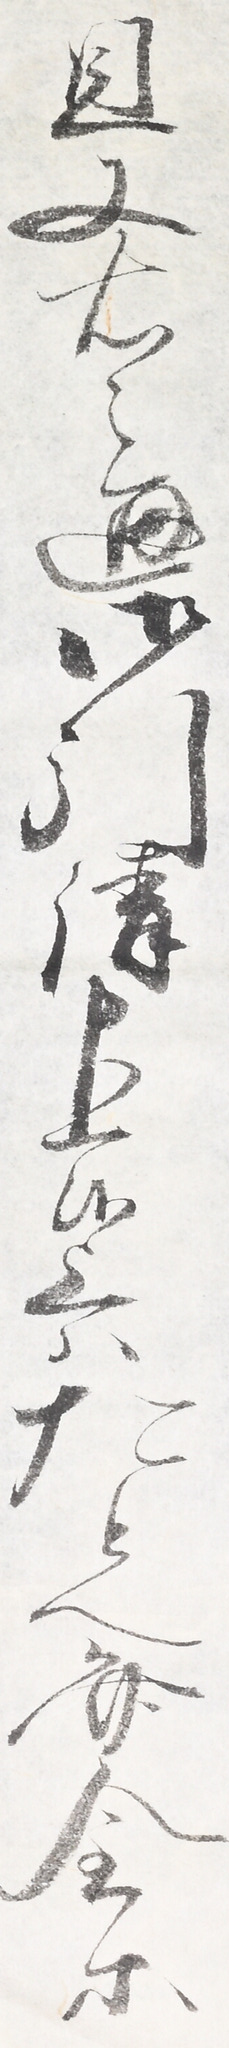且又右之通御引請申上候上ハたとへ弁金等
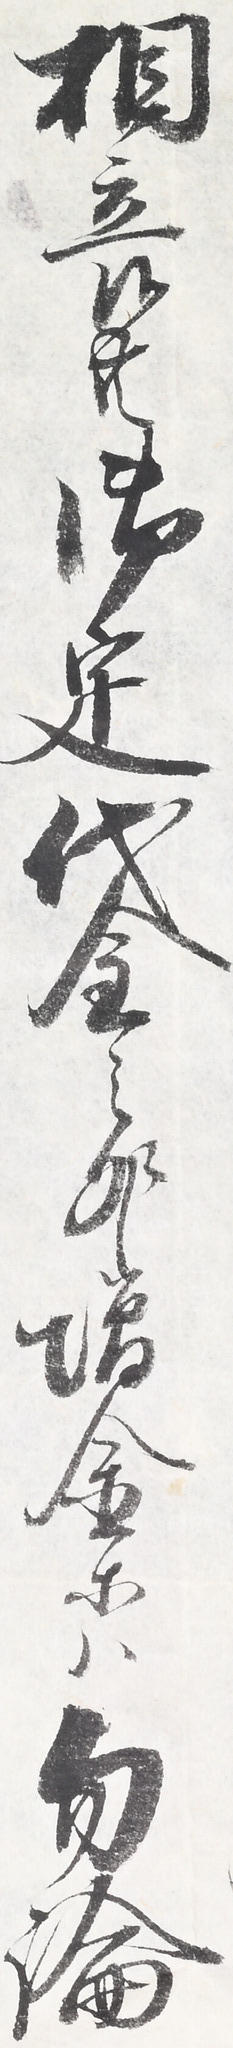相立候共御定代金之外増金等ハ勿論
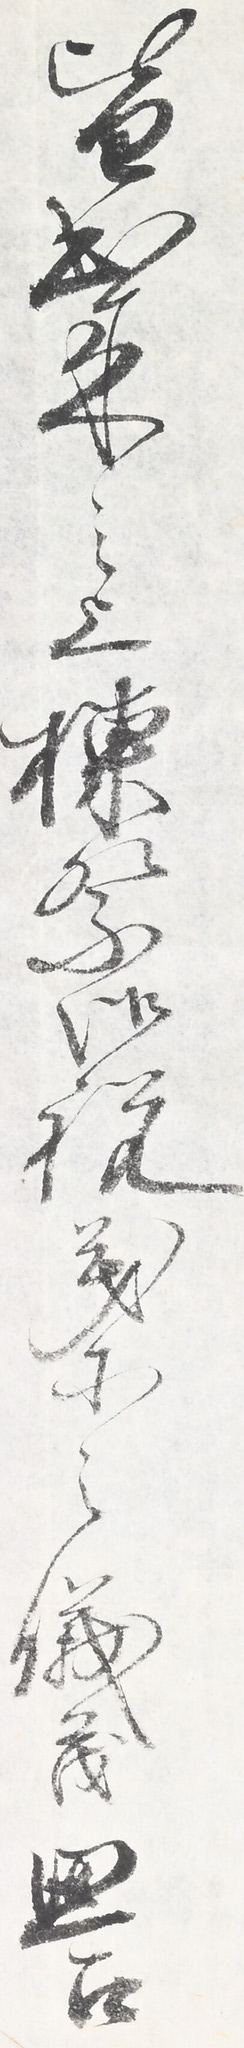皆出来之上棟祭御祝義等之儀茂思召
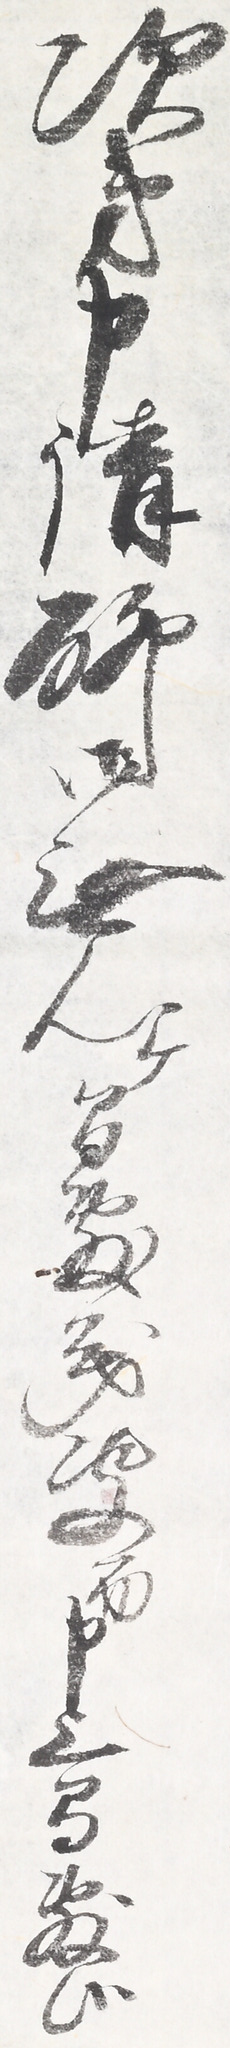次第申請聊御無心ヶ間敷義決而申上間敷候
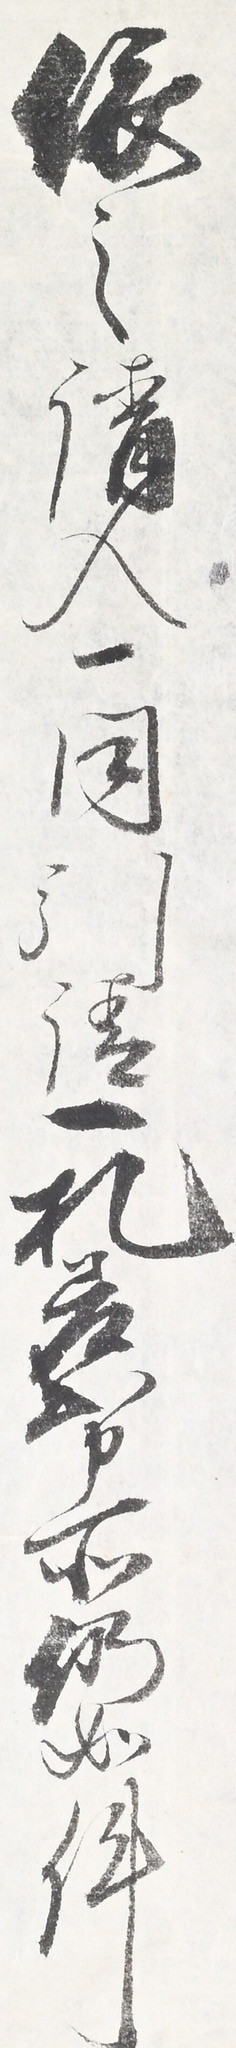依之請人一同引請一札差出申所仍如件
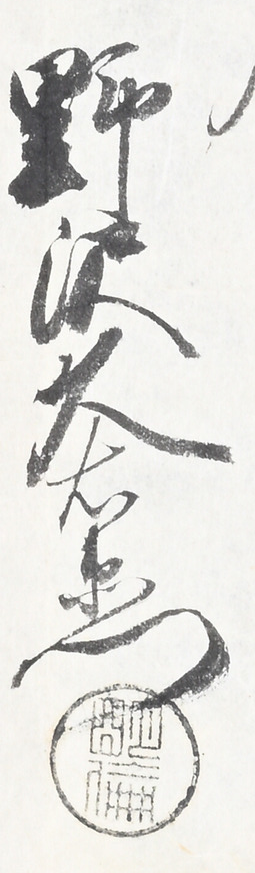野沢大右衛門㊞
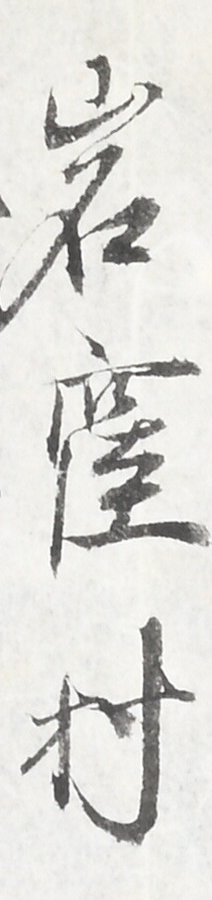岩窪村
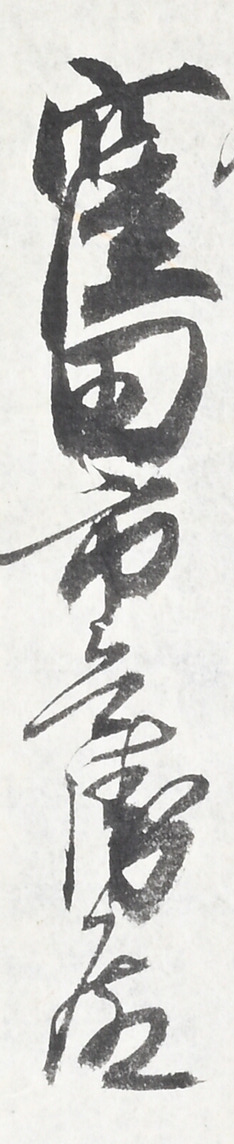窪田市兵衛殿
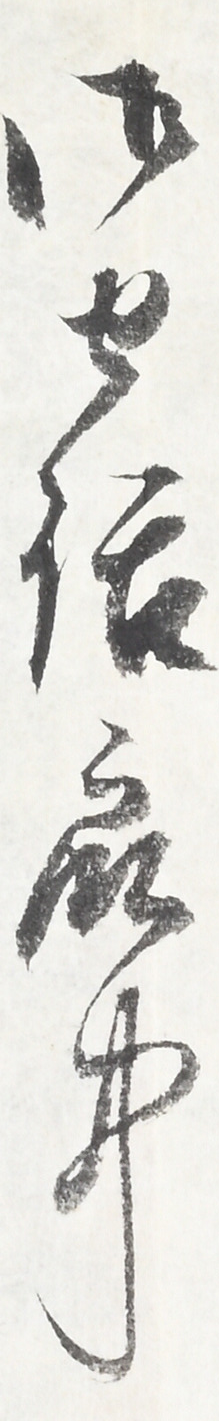御世話衆中
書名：差出申御請證文之事
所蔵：伊那市立高遠町図書館・合同会社AMANE
